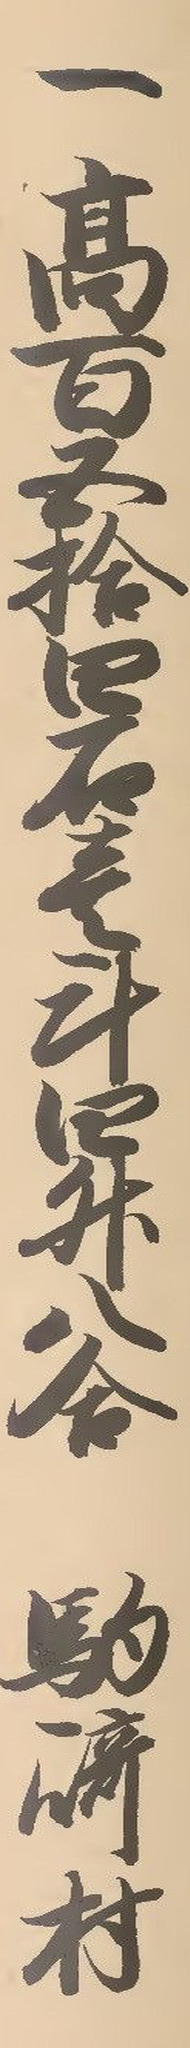一高百五拾四石壱斗四升八合駒崎村
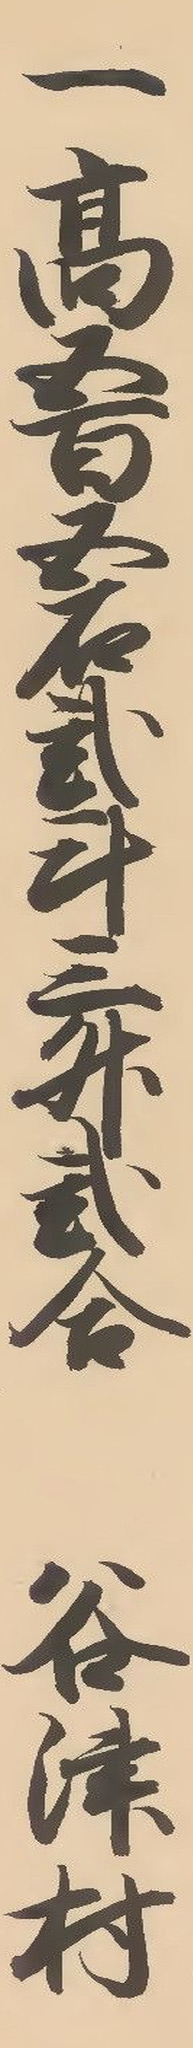一高五百五石弐斗三升弐合谷津村

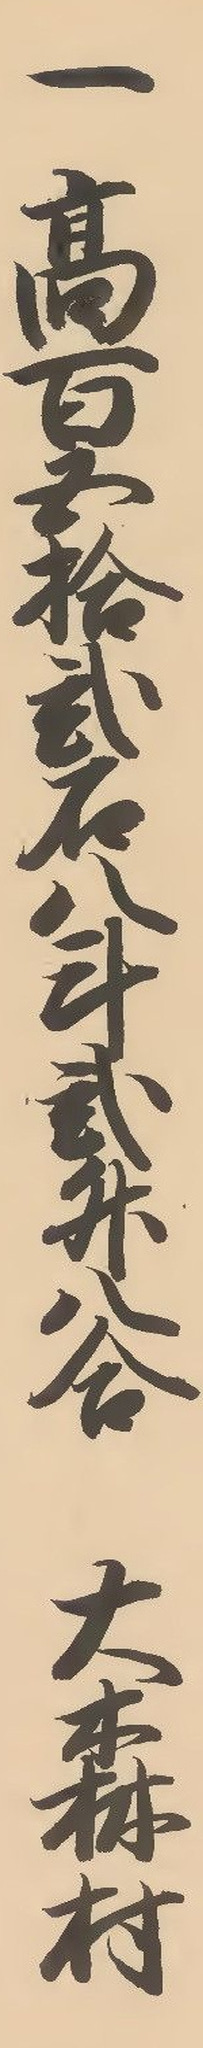一高百五拾弐石八斗弐升八合大森村
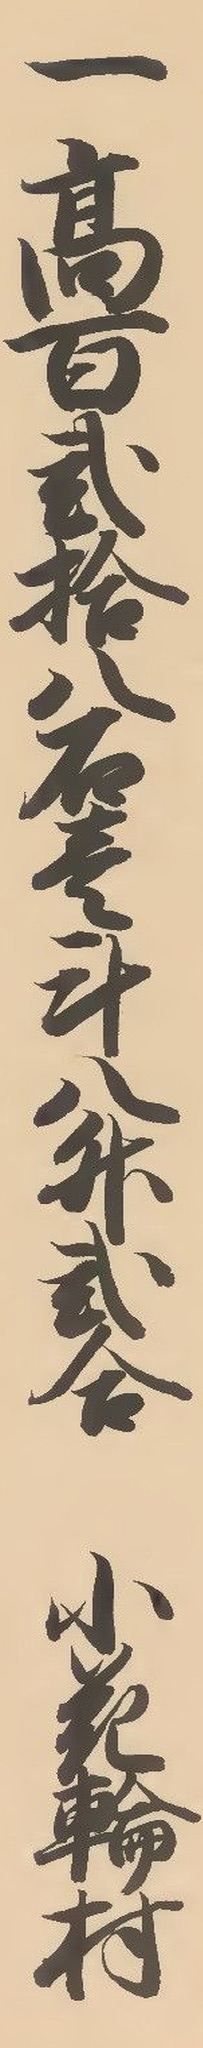一高百弐拾八石壱斗八升弐合小花輪村
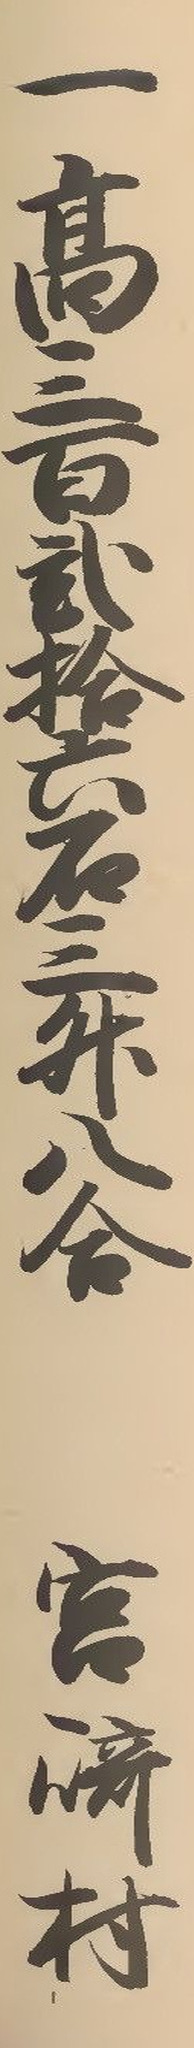一高三百弐拾六石三升八合宮崎村
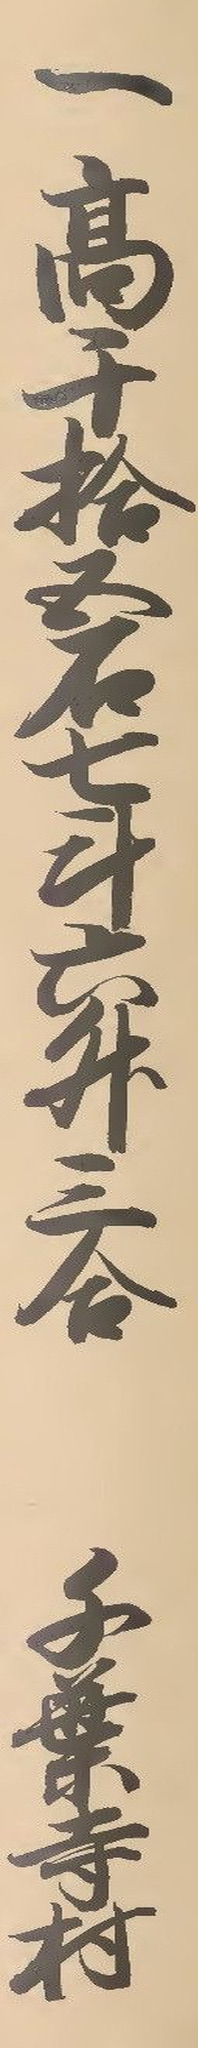一高千拾五石七斗六升三合千葉寺村
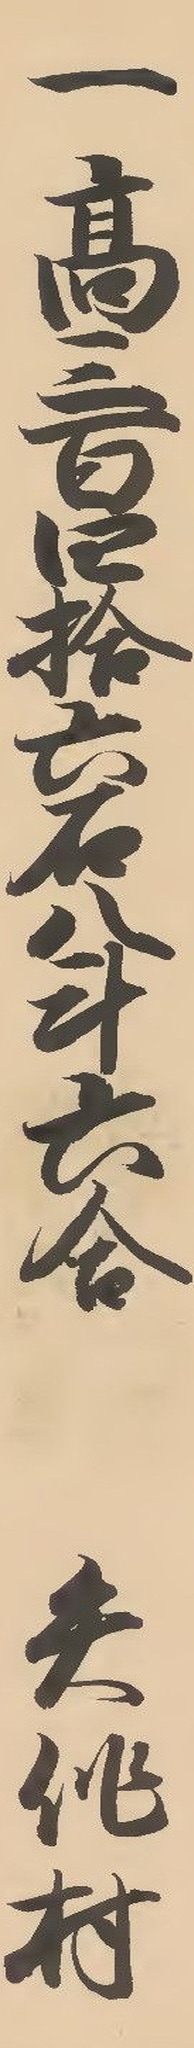一高三百四拾六石八斗六合矢作村
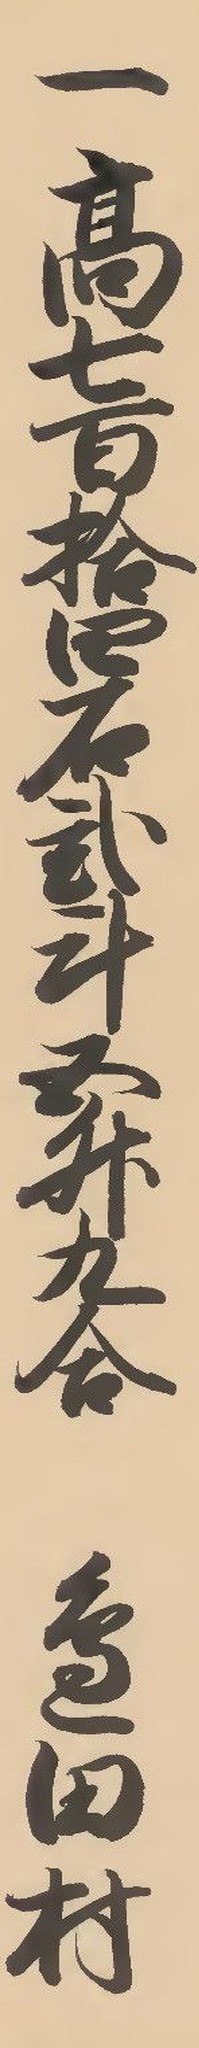一高七百拾四石弐斗五升九合辺田村
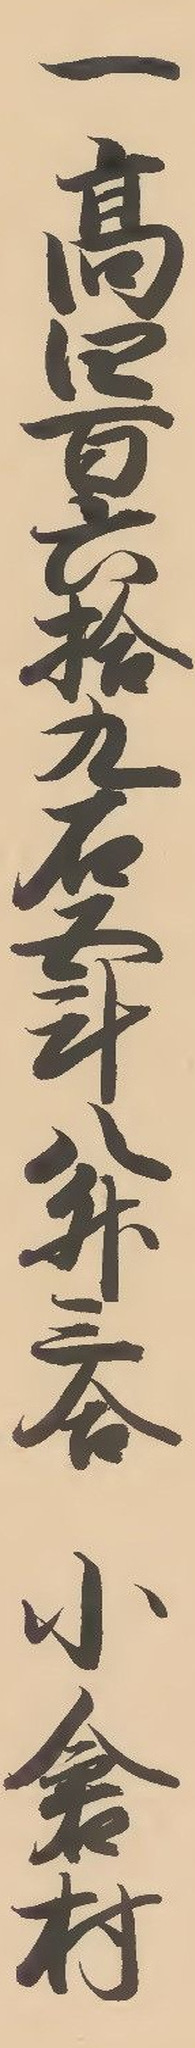一高四百六拾九石五斗八升三合小倉村

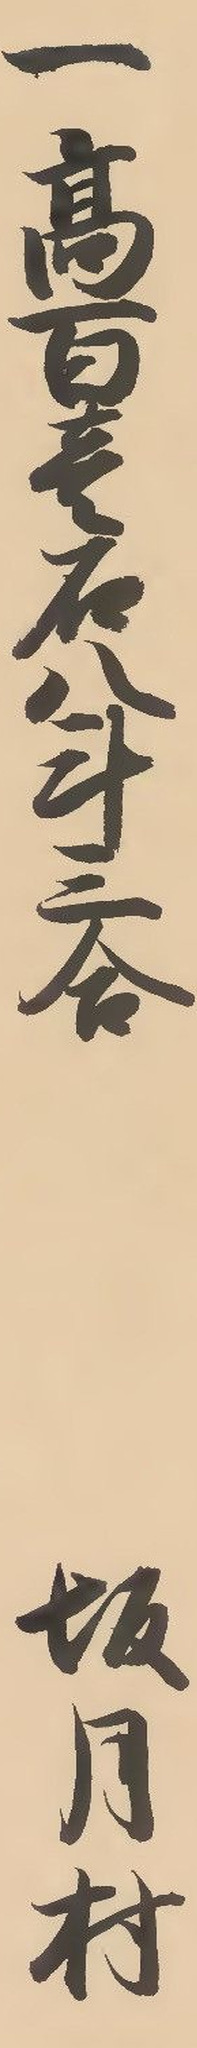一高百壱石八斗三合坂月村
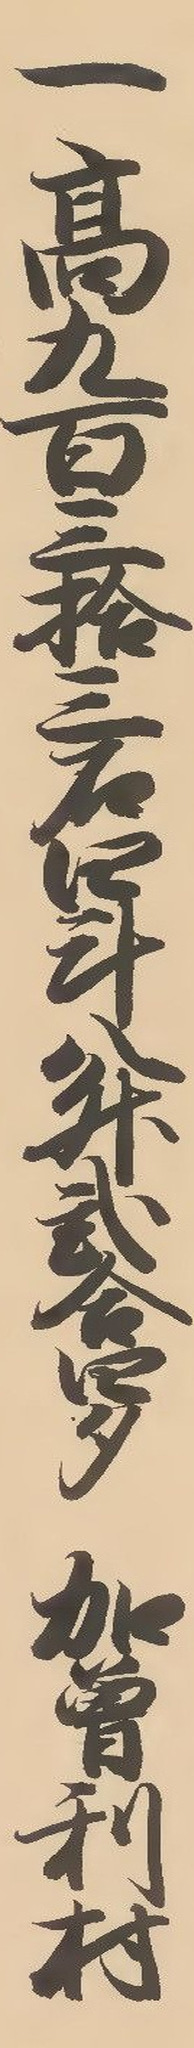一高九百三拾三石四斗八升弐合四勺加曽利村
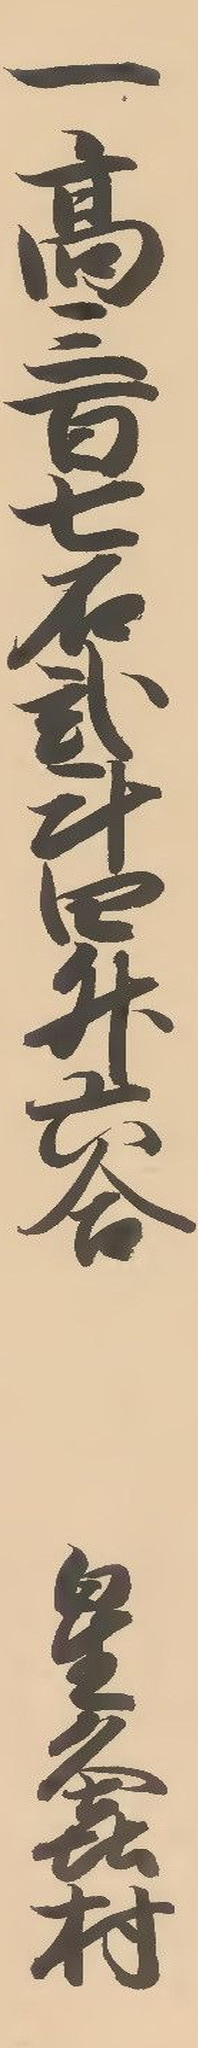一高三百七石弐斗四升六合星久喜村
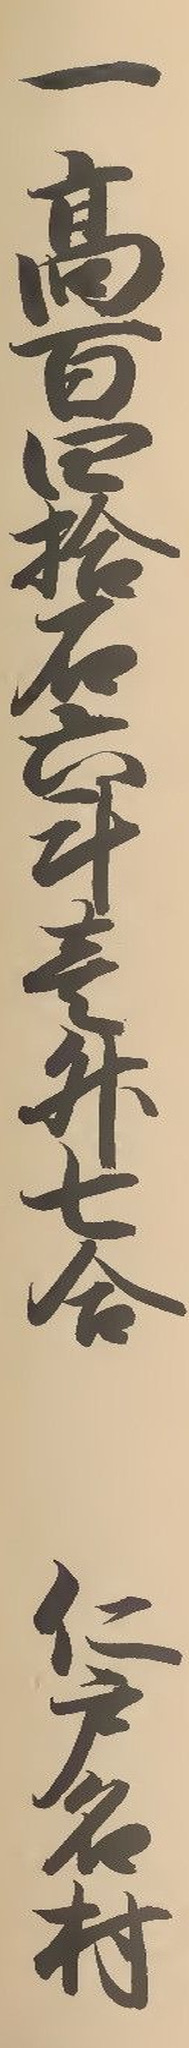一高百四拾石六斗壱升七合仁戸名村
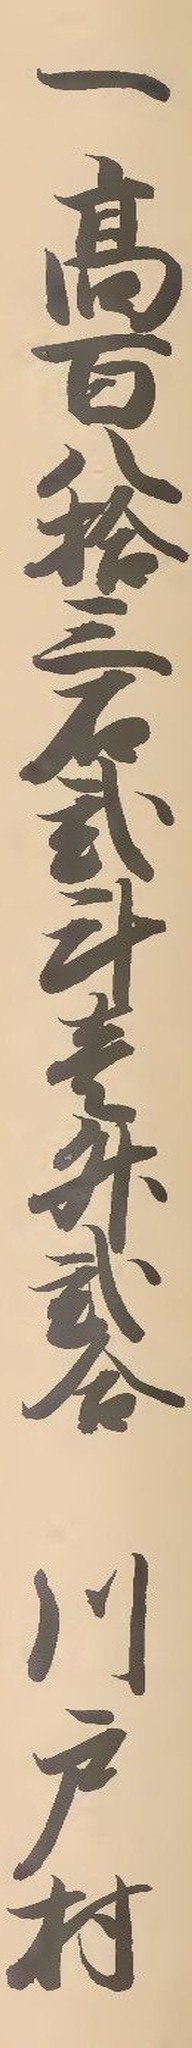一高百八拾三石弐斗壱升弐合川戸村
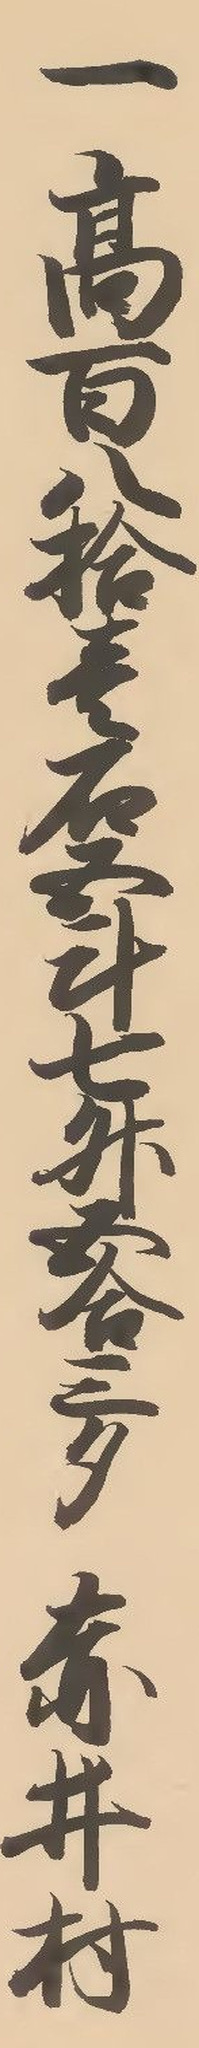一高百八拾壱石五斗七升五合三勺赤井村
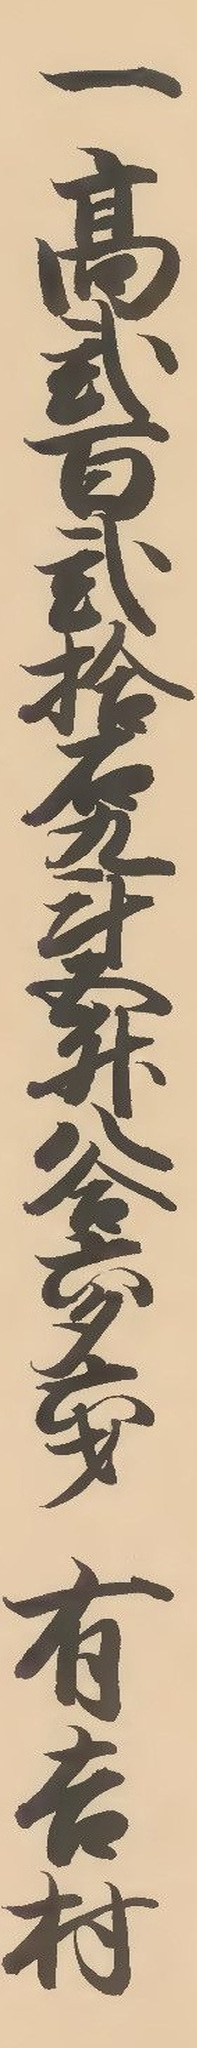一高弐百弐拾石九斗五升八合六勺六才有吉村
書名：下総国郷帳
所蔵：国立公文書館 National Archives of Japan
